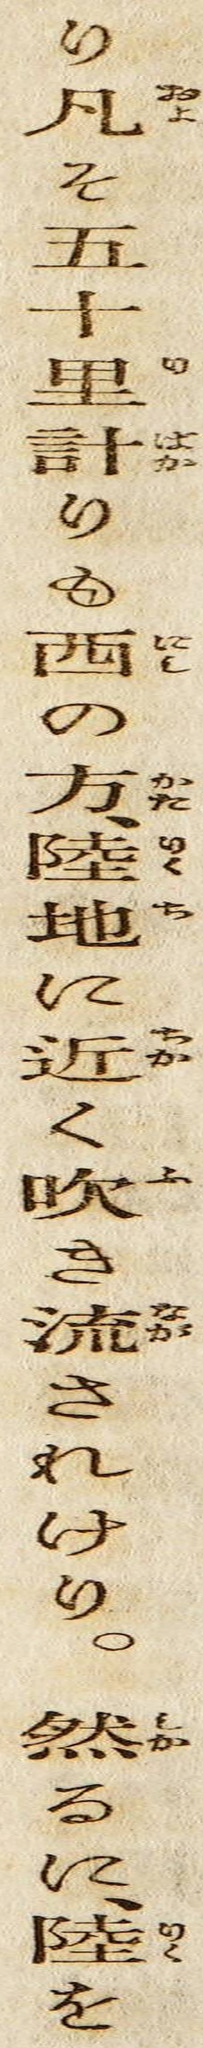り凡そ五十里計りも西の方、陸地に近く吹き流されけり。然るに、陸を
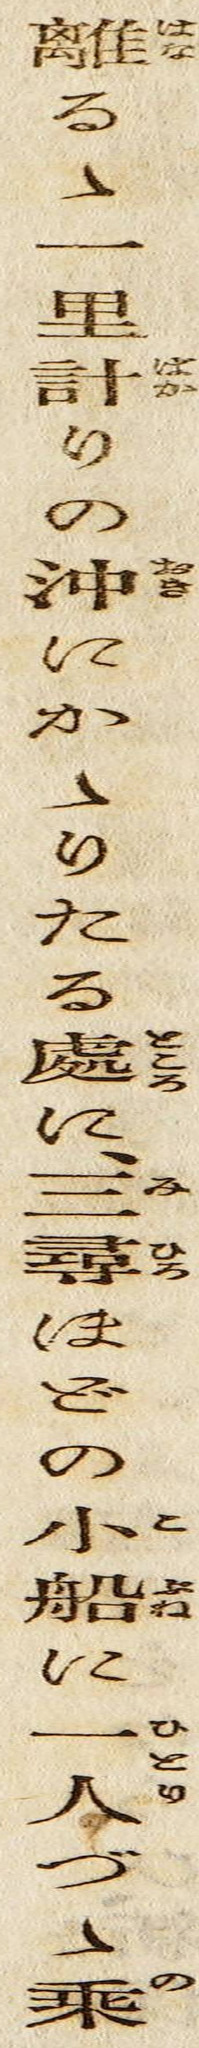離るゝ一里計りの沖にかゝりたる処に、三尋ほどの小船に一人づゝ乗
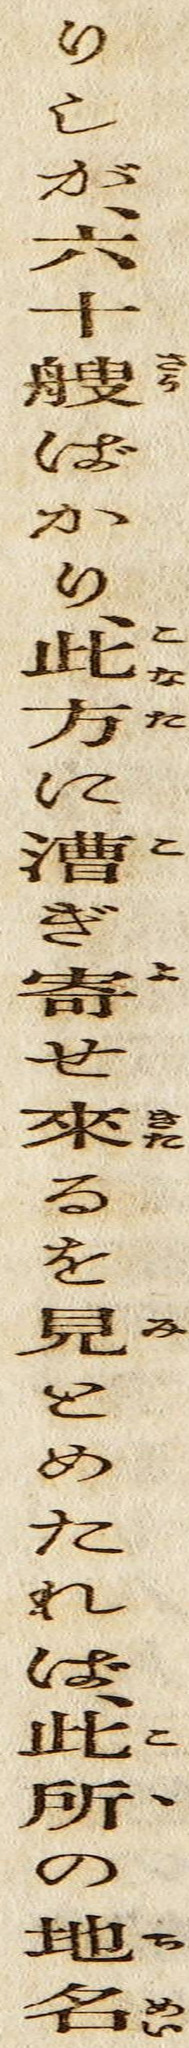りしが、六十艘ばかり、此方に漕ぎ寄せ来るを見とめたれば、此所の地名
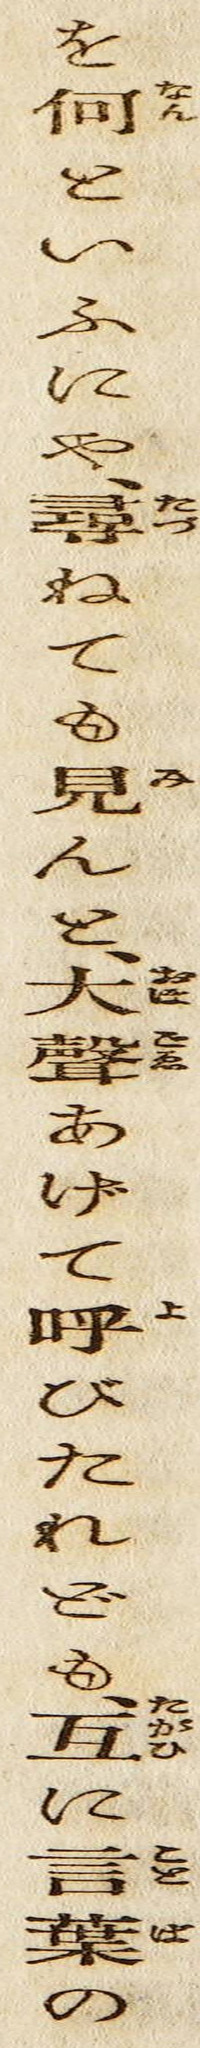を何といふにや、尋ねても見んと、大声あげて呼びたれども、互に言葉の
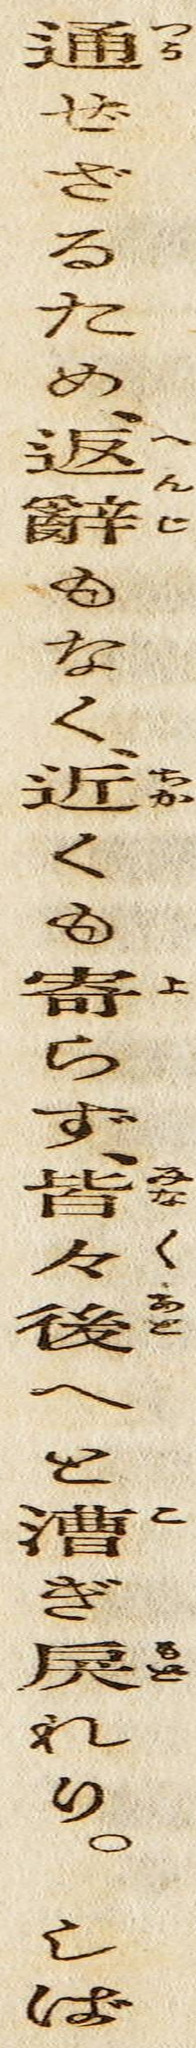通ぜざるため、返辞もなく、近くも寄らず、皆々後へと漕ぎ戻れり。しば
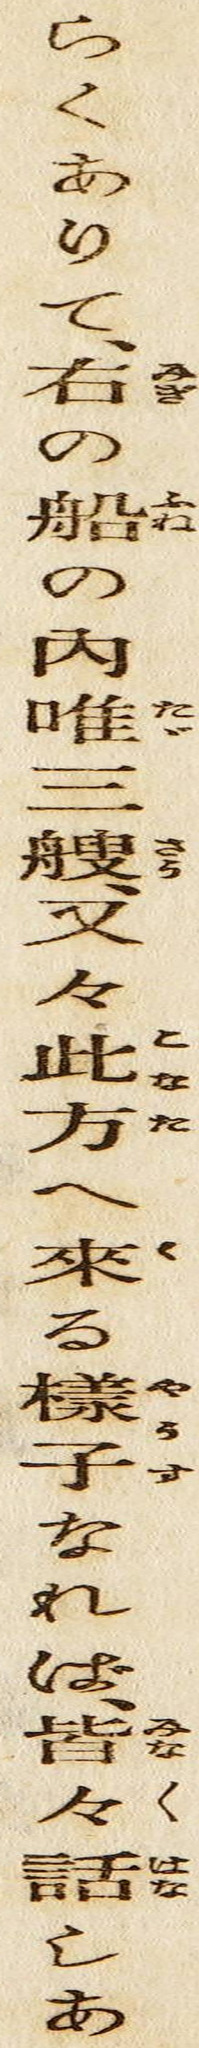らくありて、右の船の内唯三艘、又々此方へ来る様子なれば、皆々話しあ
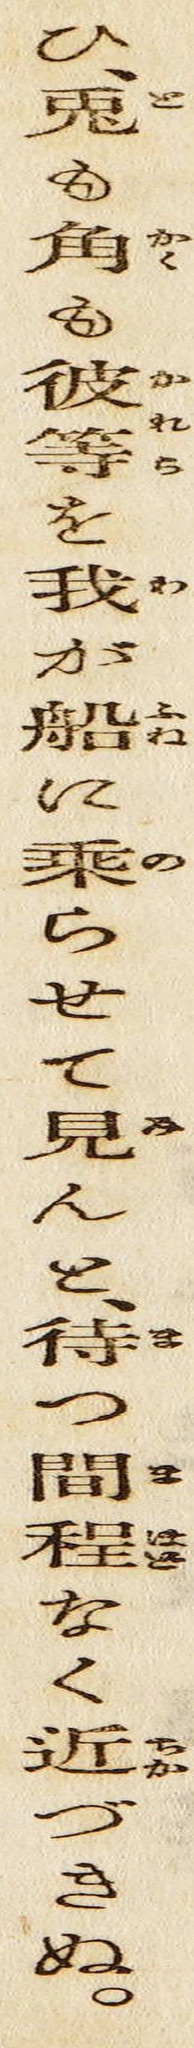ひ、兎も角も彼等を我が船に乗らせて見んと、待つ間程なく近づきぬ。
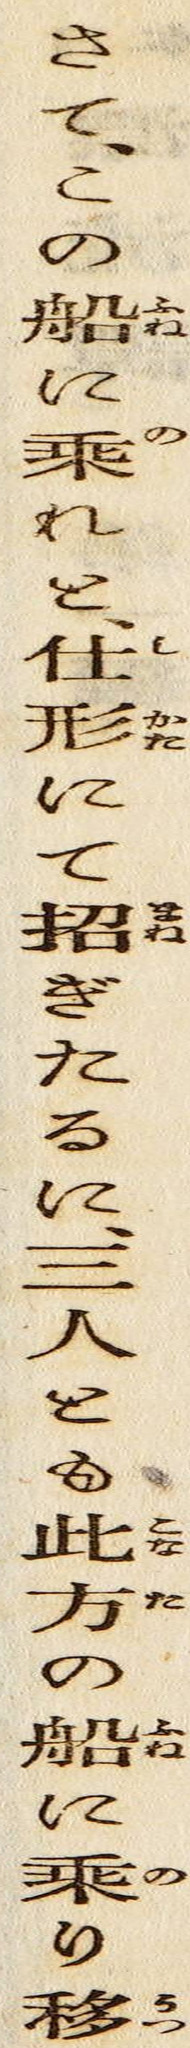さて、この船に乗れと、仕形にて招ぎたるに、三人とも此方の船に乗り移
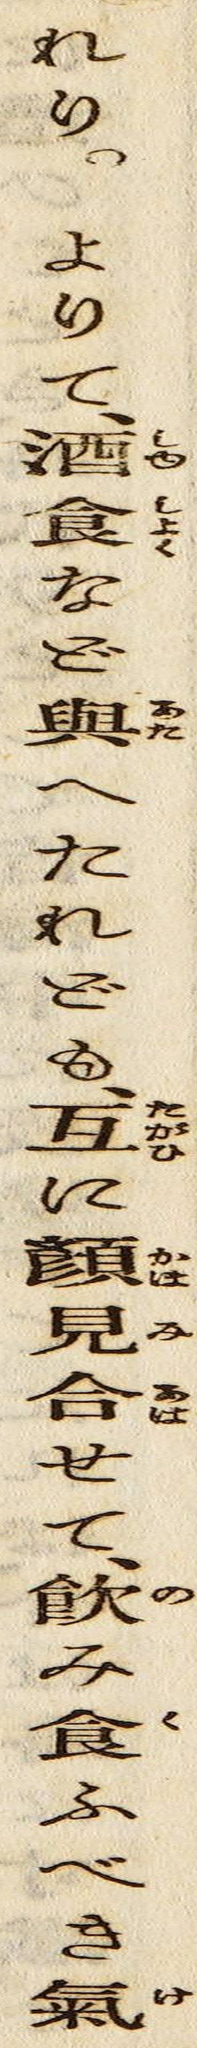れり。よりて、酒食など与へたれども、互に顔見合せて、飲み食ふべき気
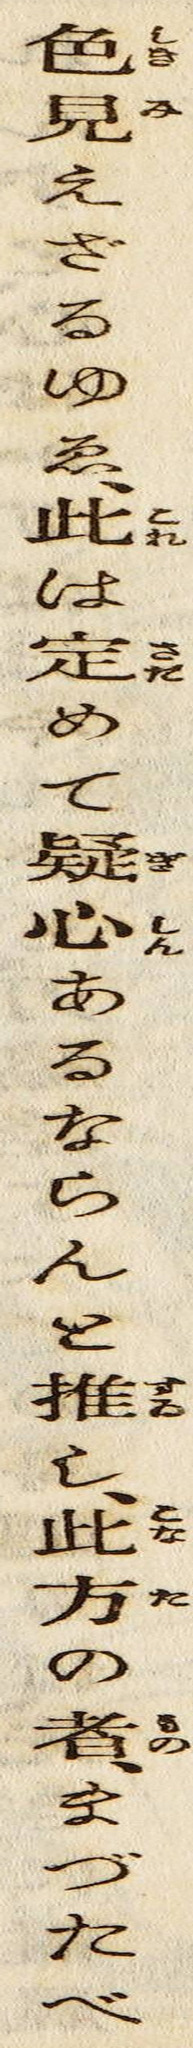色見えざるゆゑ、此は定めて疑心あるならんと推し、此方の者、まづたべ
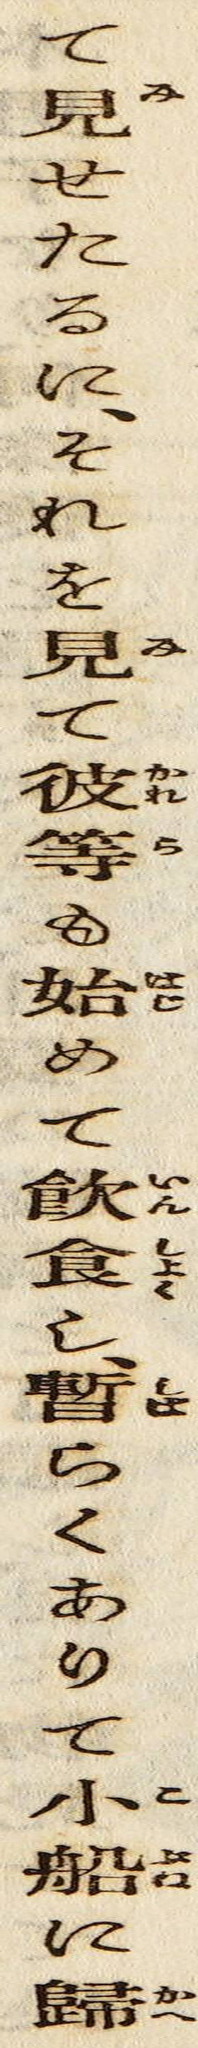て見せたるに、それを見て彼等も始めて飲食し、暫らくありて小船に帰
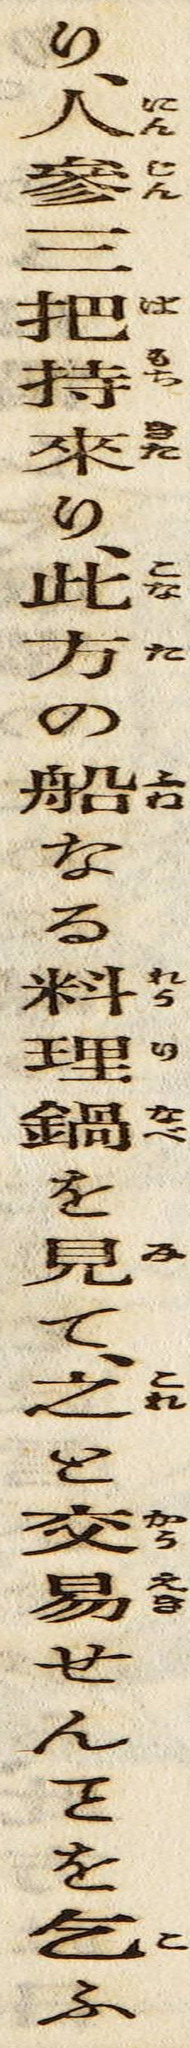り、人参三把持来り、此方の船なる料理鍋を見て、之と交易せんことを乞ふ
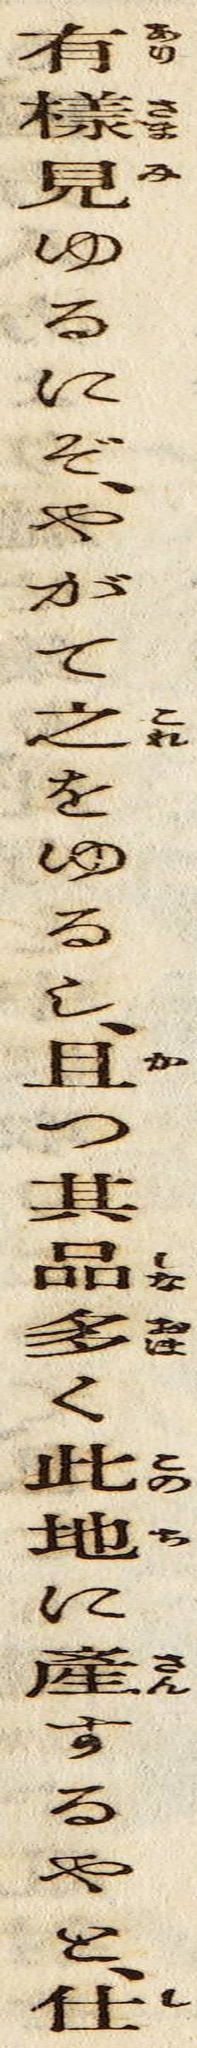有様見ゆるにぞ、やがて之をゆるし、且つ其品多く此地に産するやと、仕
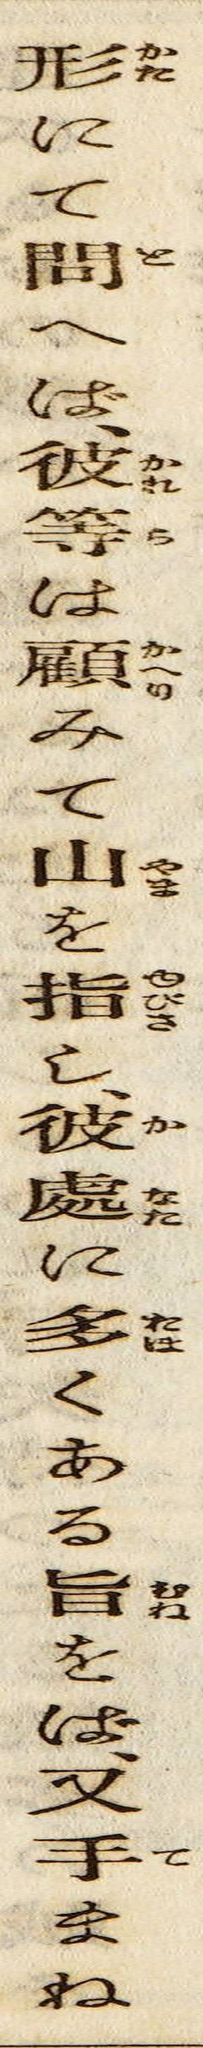形にて問へば、彼等は顧みて山を指し、彼処に多くある旨をば、又手まね
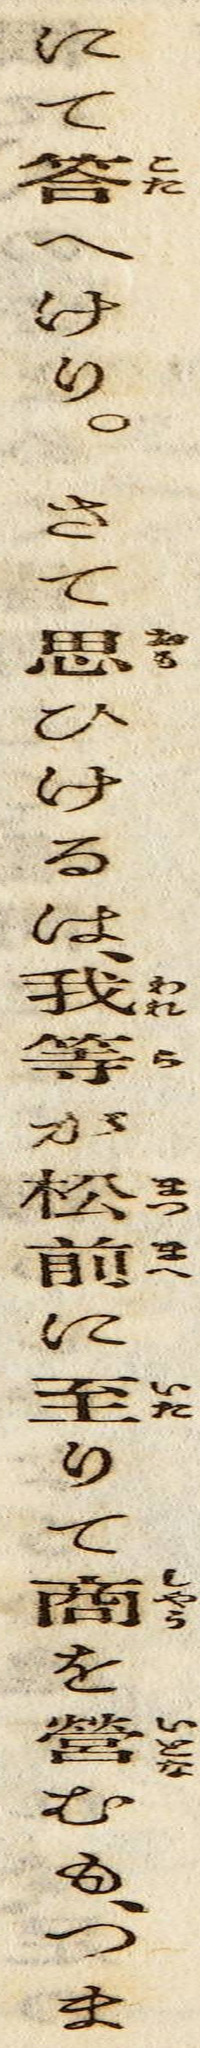にて答へけり。さて思ひけるは、我等が松前に至りて商を営むも、つま
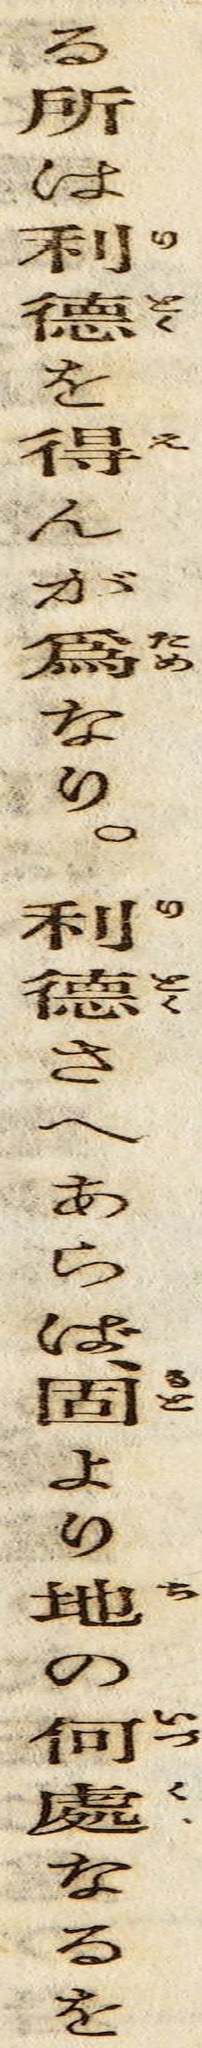る所は利徳を得んが為なり。利徳さへあらば、固より地の何処なるを
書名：日本漂流譚
